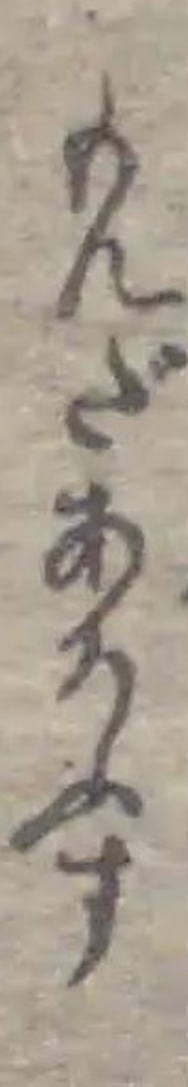もんだあろふす
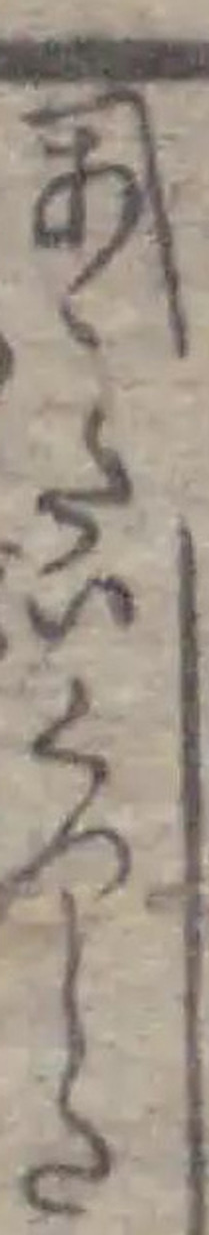〽あゝたいくつした
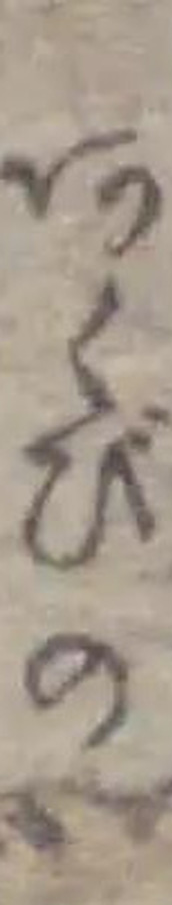あくびの
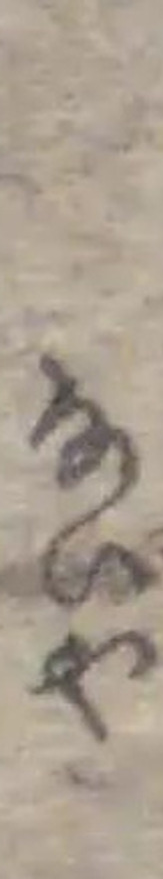ないや
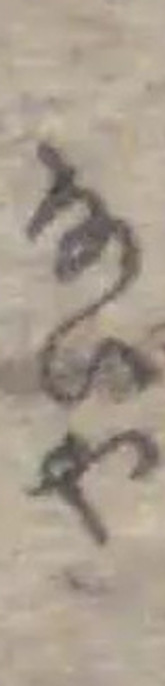ないや
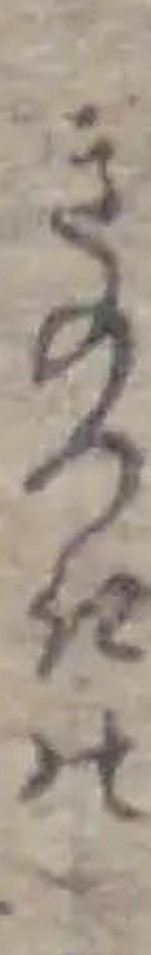きのつきの

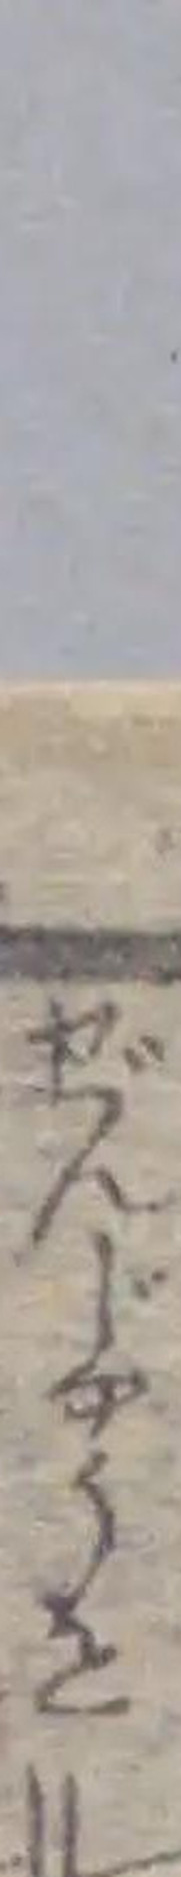ぜんじやうを
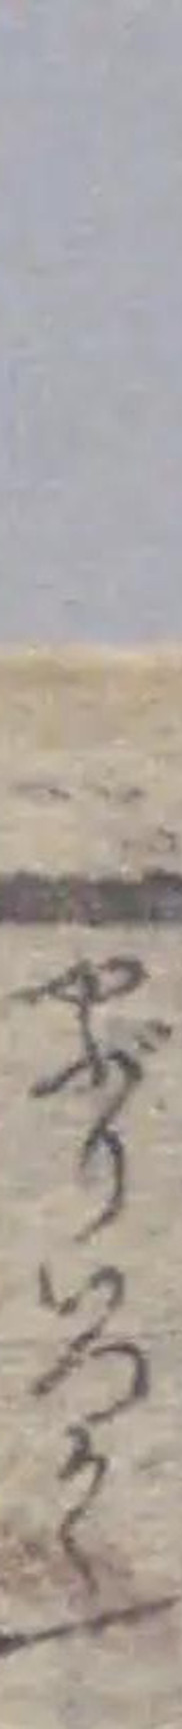やぶりいつかく
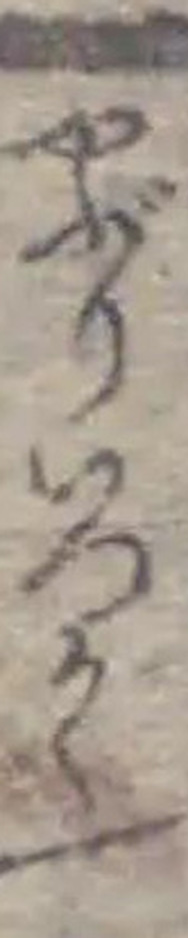やぶりいつかく
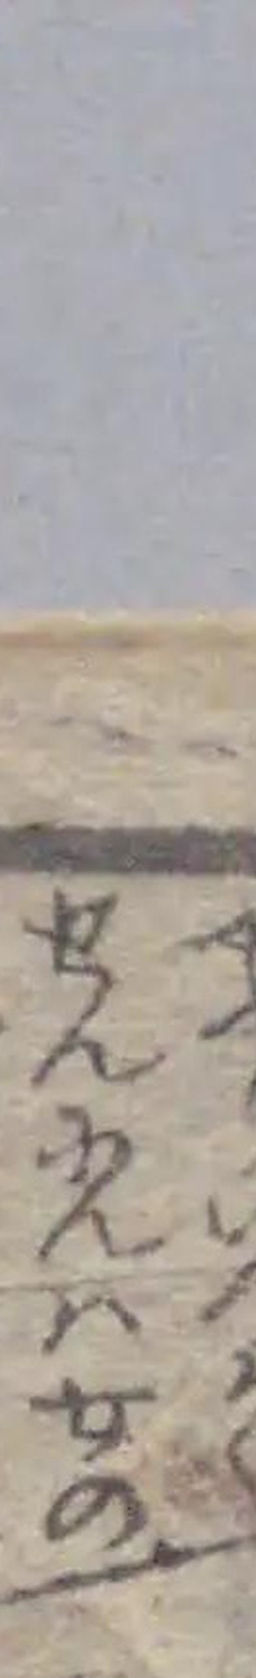せんにんは女の
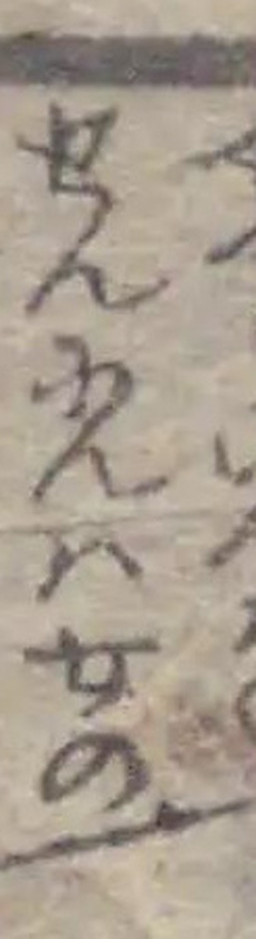せんにんは女の
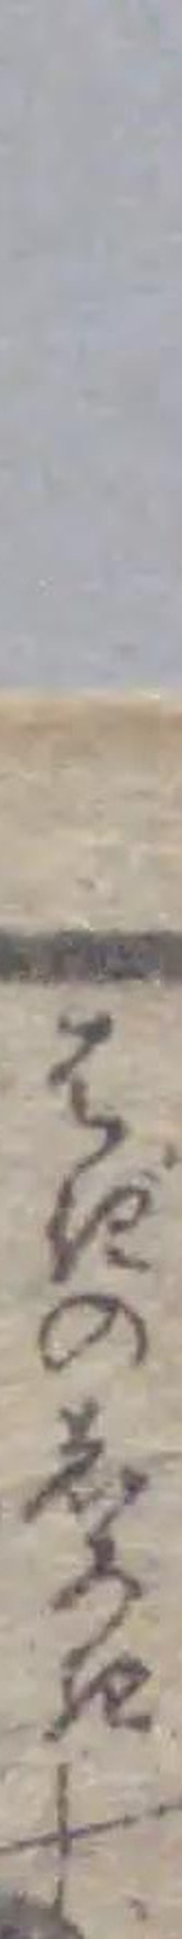はぎのしろき
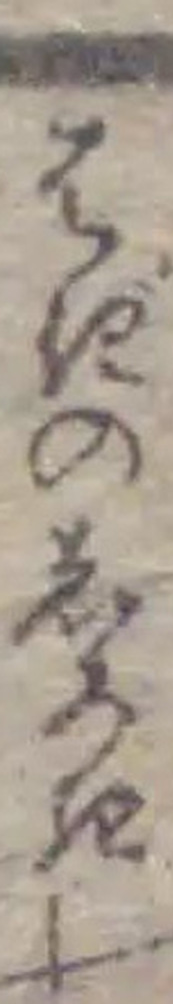はぎのしろき
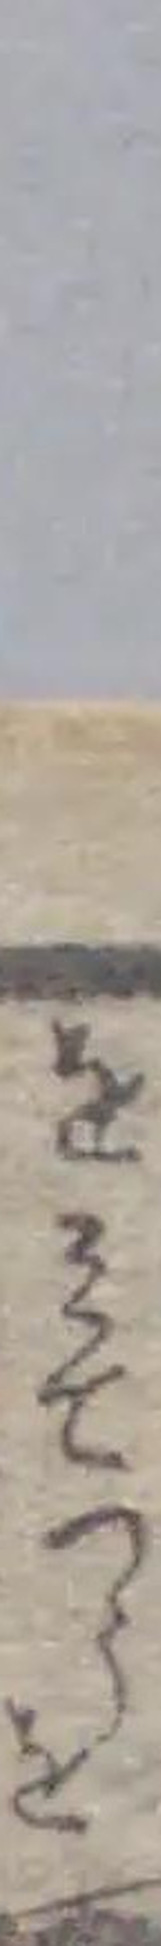をみてつうを
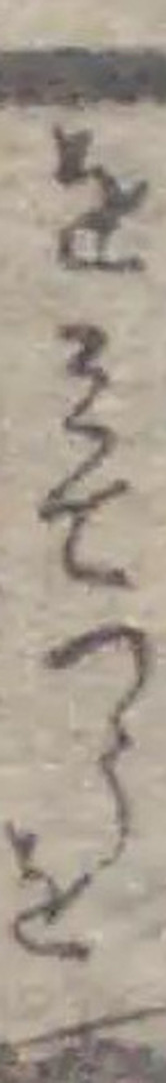をみてつうを
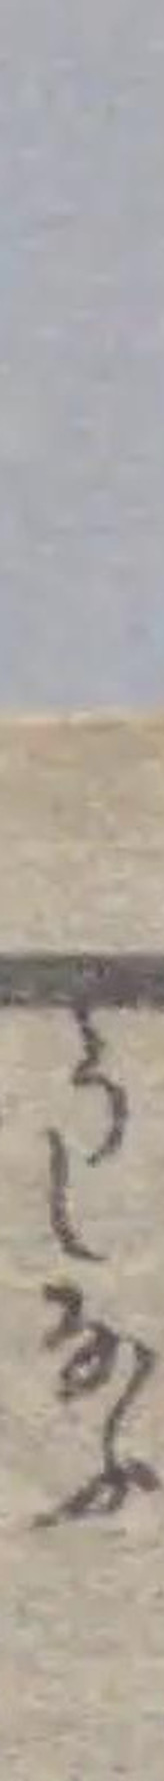うしなふ
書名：福壽海旡量品玉 3巻
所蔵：国立国会図書館 National Diet Library, JAPAN
